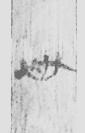卌
